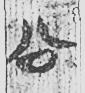公
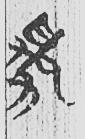爭
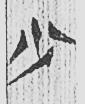少
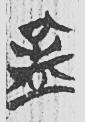{孔皿}
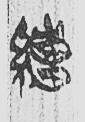{糸東田}
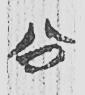公
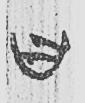曰
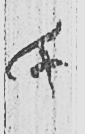氏
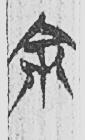余
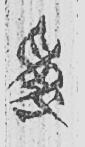受
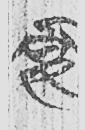妻
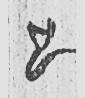也
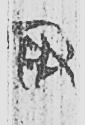取
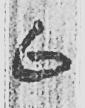㠯（以）
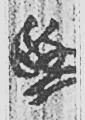爲
